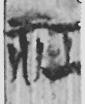{示工}
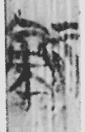{示朿}
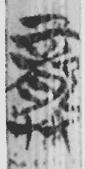龏
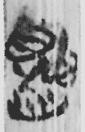{見心臼}
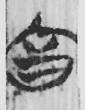亯
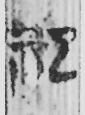祀
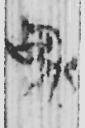和
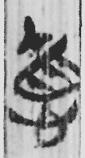惪
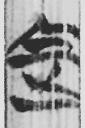定
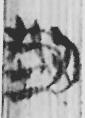型
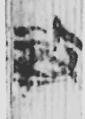政
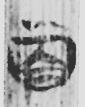百
